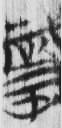戠
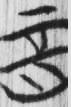酉（酒）
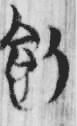○（食）
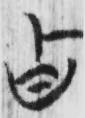占
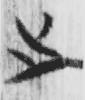之
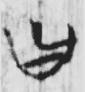曰
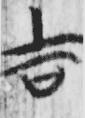吉
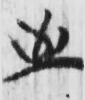至
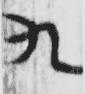九
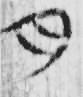月
